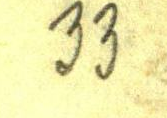33
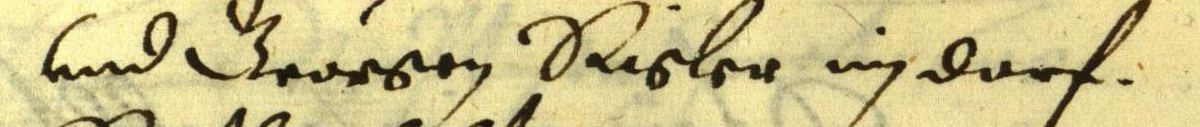vnd Geōrgen Rigler im dorf.
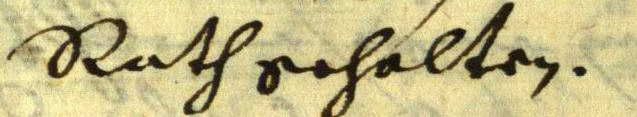Rath gehalten.
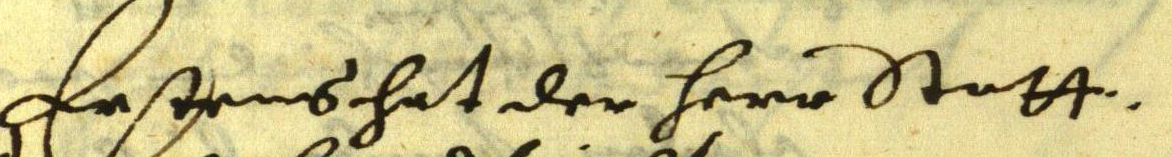Erstens hat der herr Statt¬
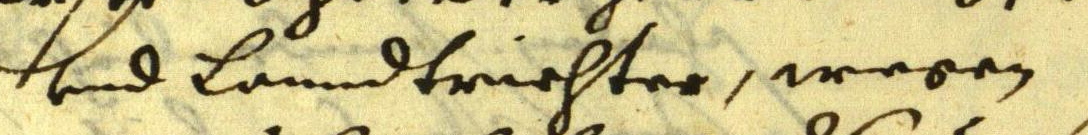vnd Lanndtrichter, wegen
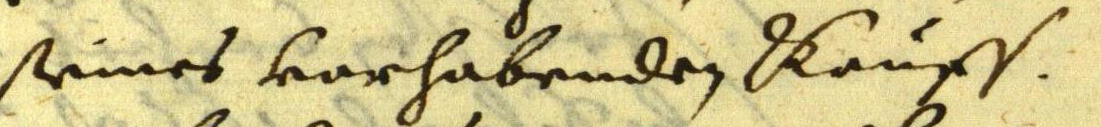seines vorhabenden Kaūfs.
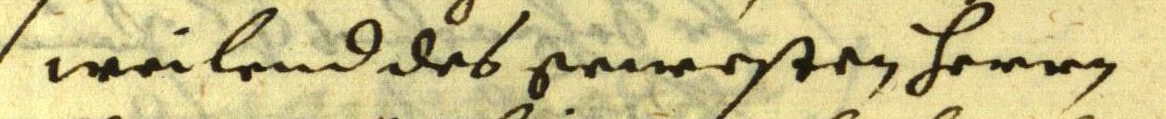weilend des gewesten herrn
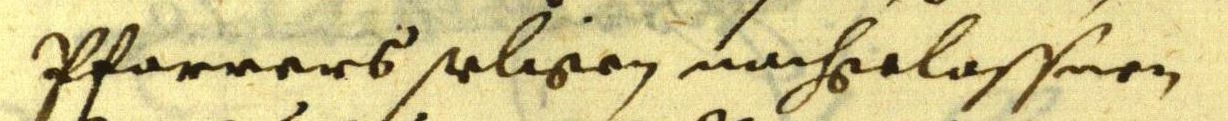Pfarrers seligen nachgelassnen
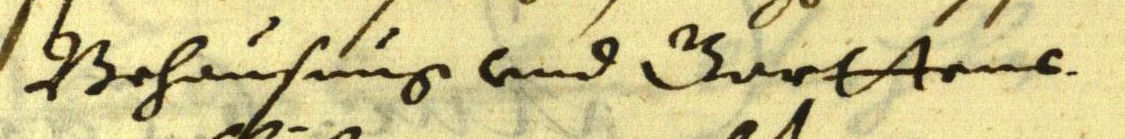Behaūsūng vnd Garttens.
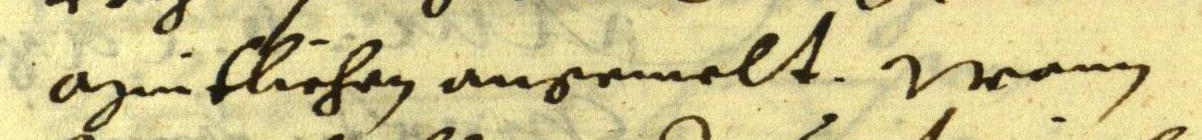Mintlichen angemelt. wann
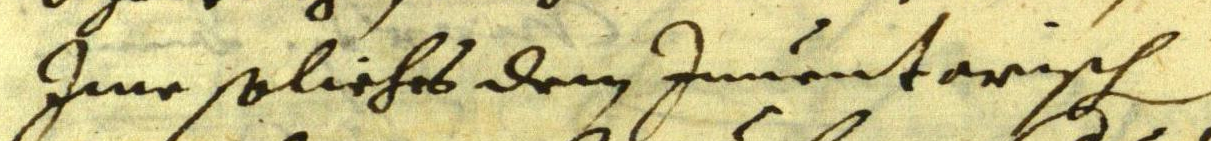Ime soliches dem Inūentarisch
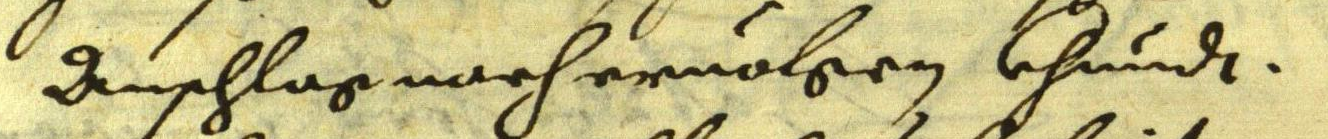Anschlag nach erūolgen khūndt.
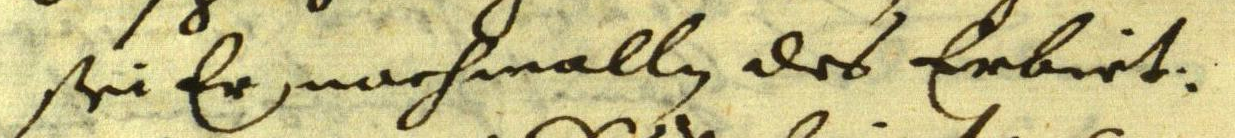sei Er nochmalln des Erbiet¬
